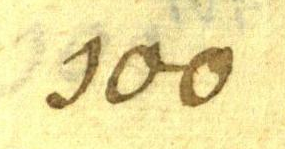100
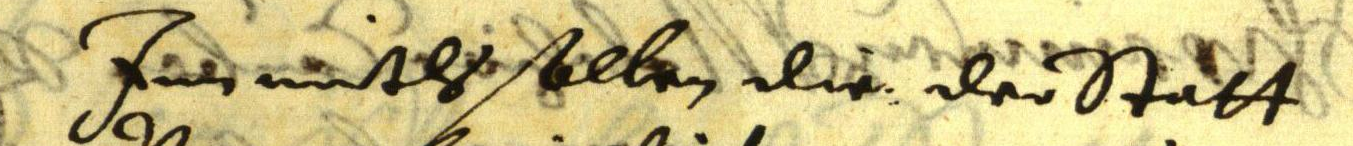Inen mitls selben die: der Statt
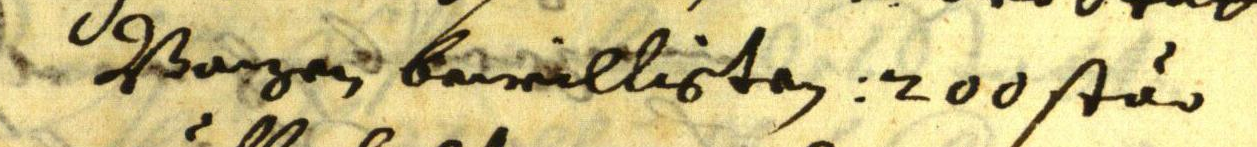Bozen bewilligten: 200 stār
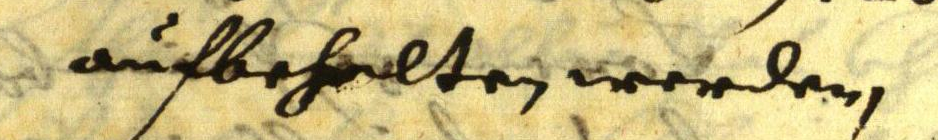aūfbehalten werden,
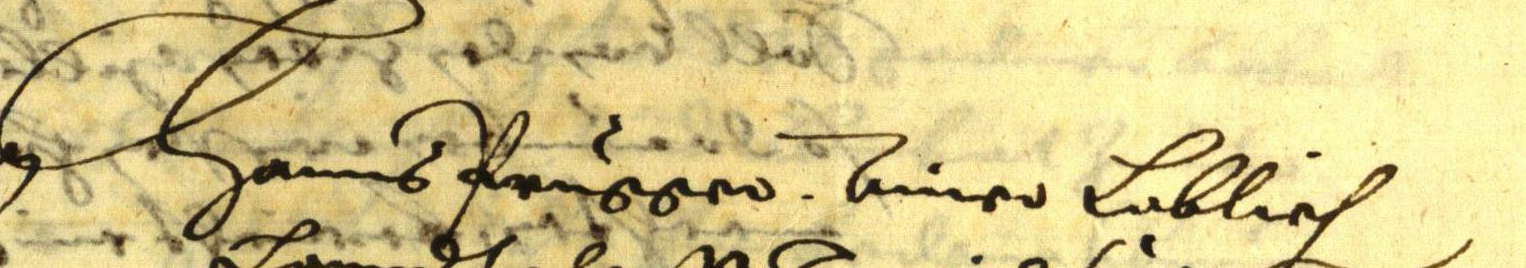Hanns Prūgger. Ainer Loblich
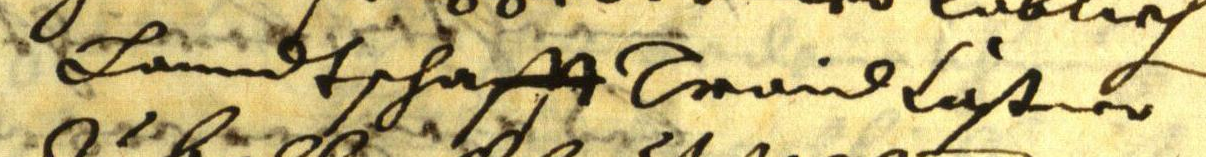Lanndtschafft Traid Cāstner
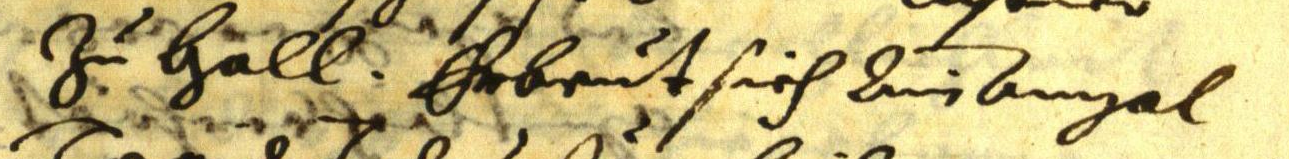Zū Hall. Erbeūt sich Ain Anzal
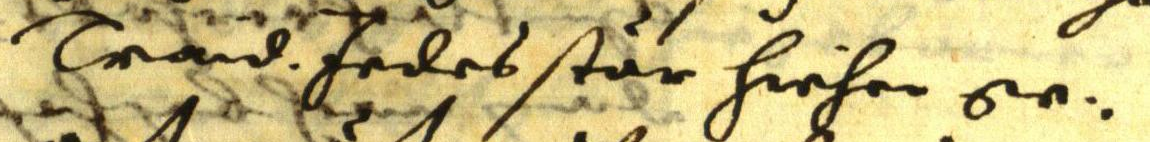Traid. Jedes stār hieher ge¬
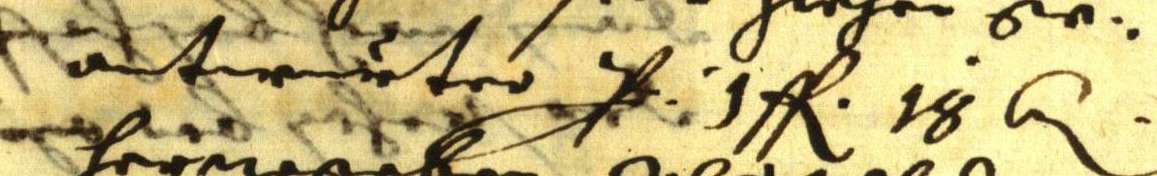antwūrter P: 1 fl. 18 k.
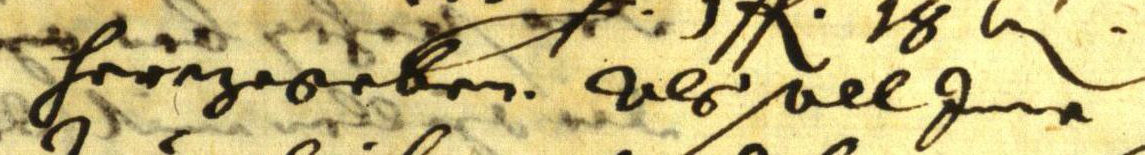herzegeben. Als soll Ime
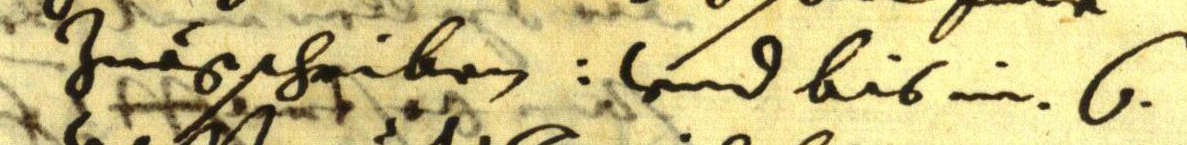Zūegschriben: vnd bis in .6.
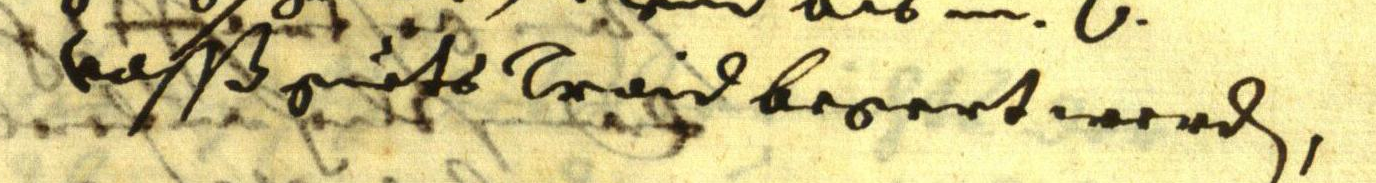vasß gūets Traid begert werd,
